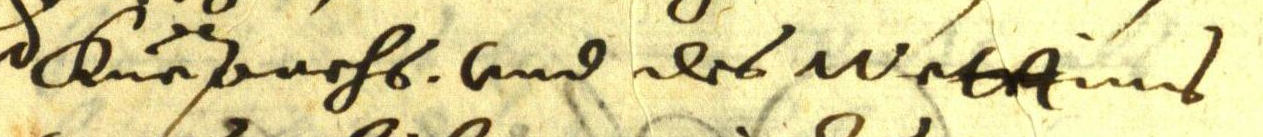KūePachs. vnd des Wettins
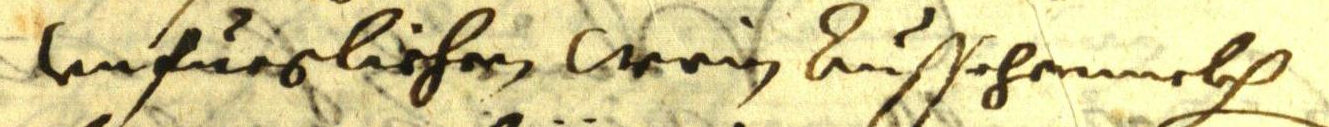vnfūeglichen wein Aūsschenckh
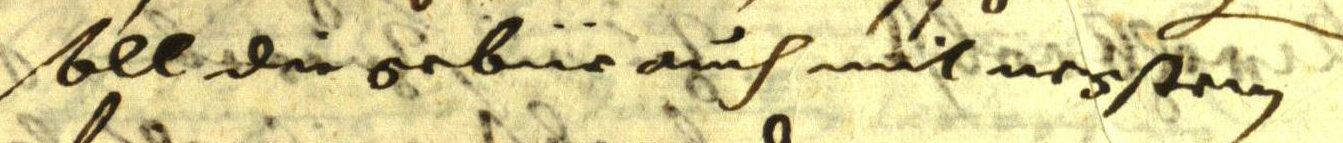soll die gebür aūch mit negsten
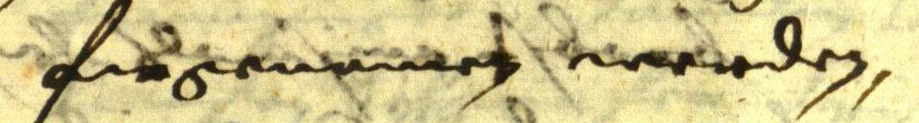firgenomen werden,
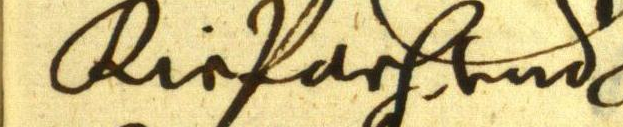KiePach. vnd
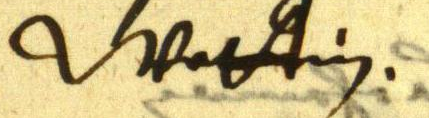Wettin.
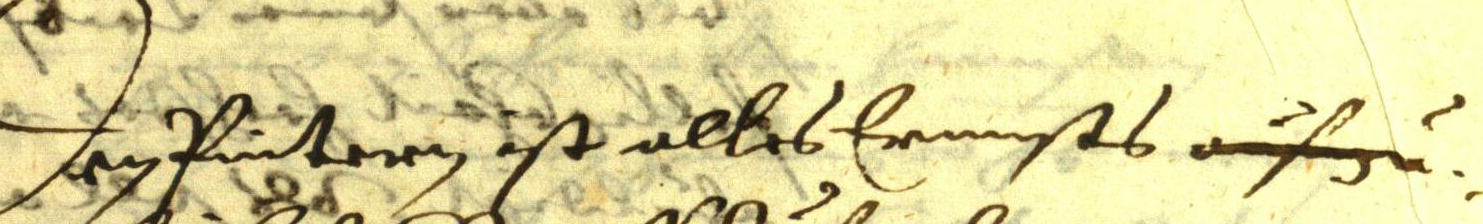Den Pintern ist alles Ernnsts aūfzū¬
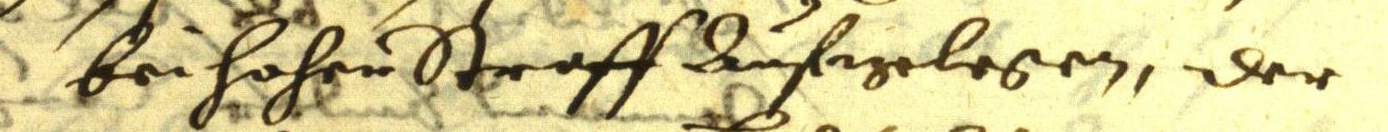bei hoher Straff Aūfzelegen, der
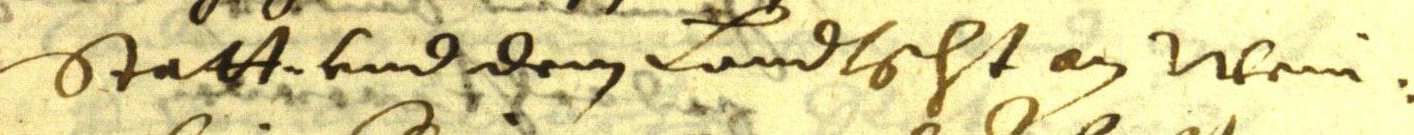Statt: vnd dem Landtght an Wein¬
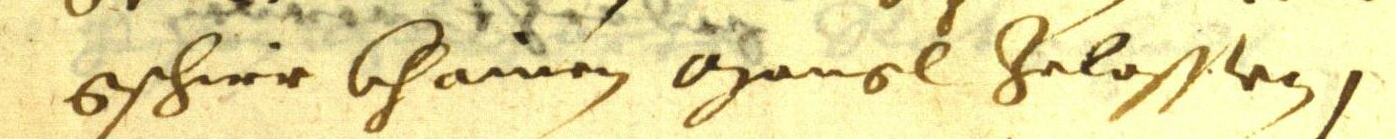gschirr khainen Mangl Zelassen/
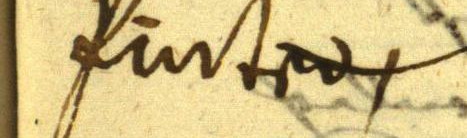Pinter/
